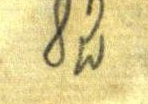82
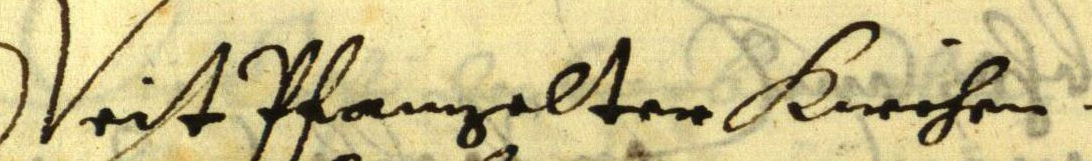Veit Pfanzelter Kirchen¬
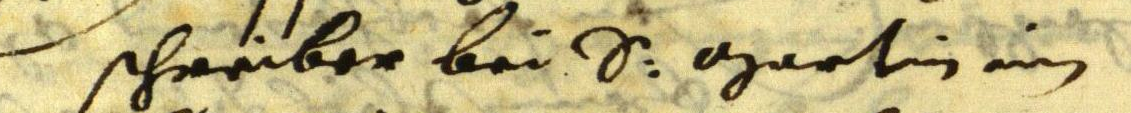schreiber bei S: Martin im
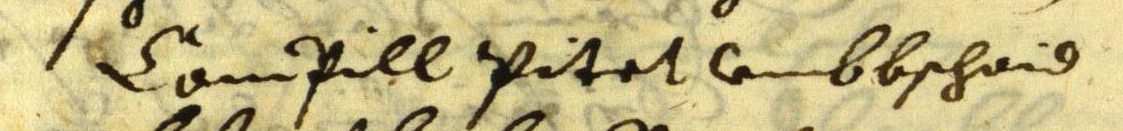CamPill Pitet vmb bschaid
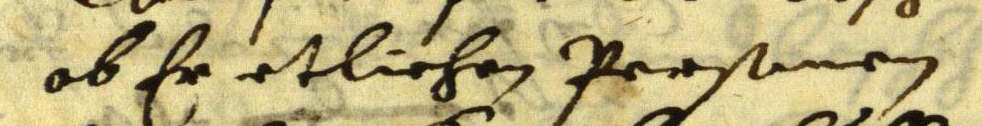ob Er etlichen Personen
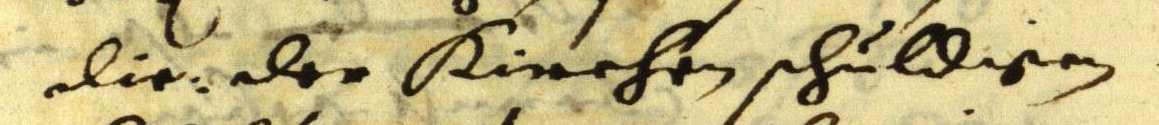die: der Kirchen schūldigen
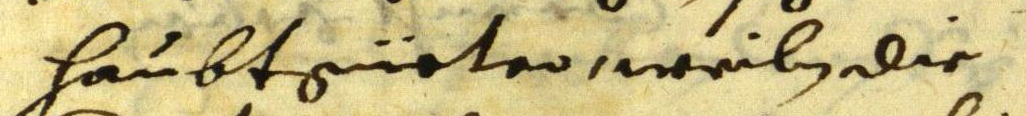haūbtgūeter, weiln die
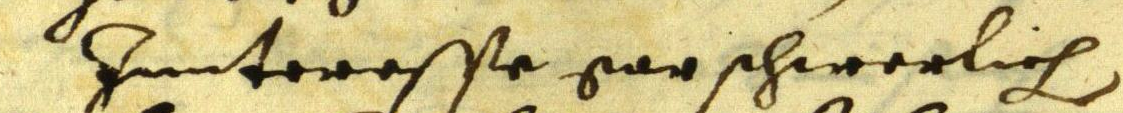Innteresse gar schwerlich
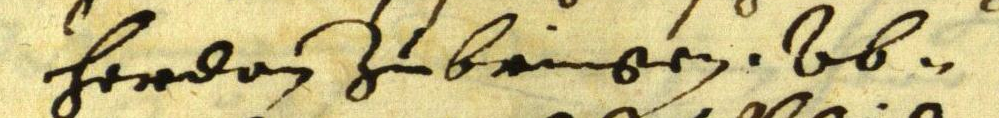herdan Zū bringen. Ab¬
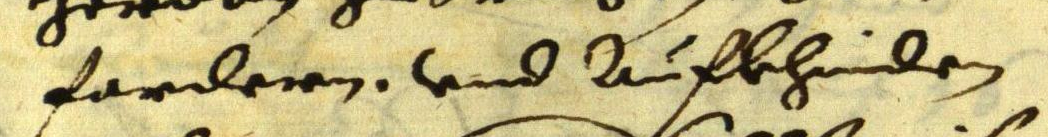fordern. vnd Aūfkhinden
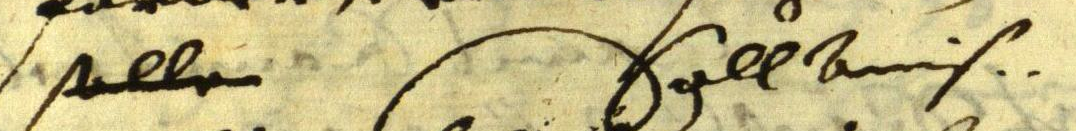sollen Soll Ains¬
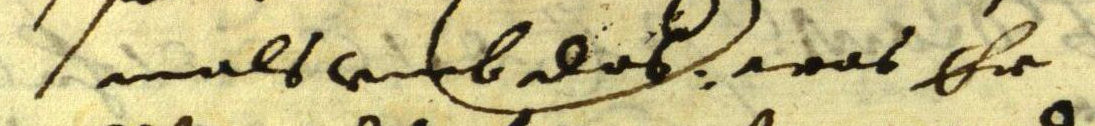mals vmb das: was Er
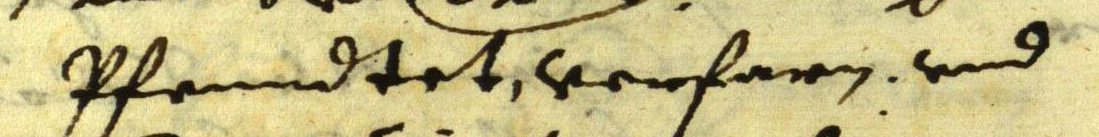Pfenndtet, verfarn. vnd
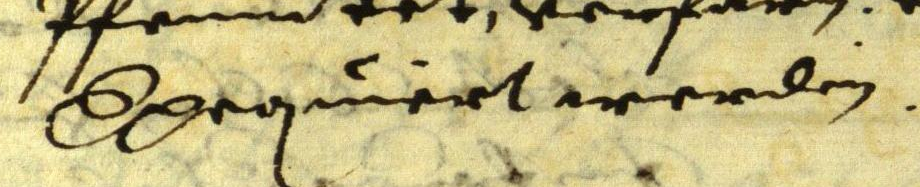Exeqūiert werden.
